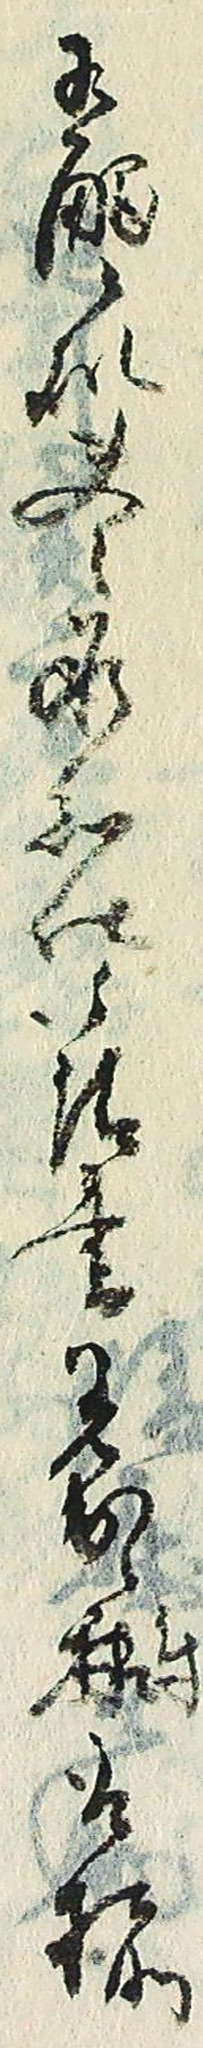相触候処夫々承知仕御請書差出候様取揃
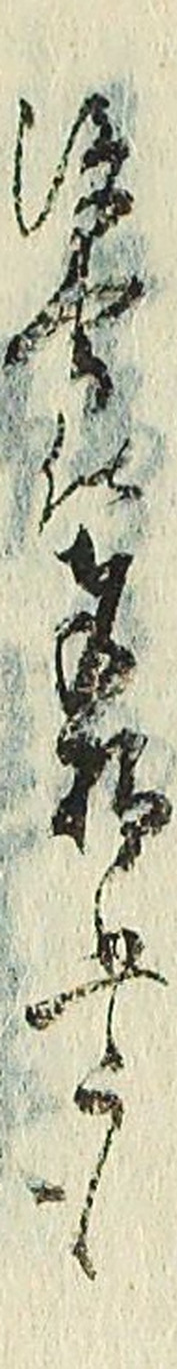添書仕奉指上候以上
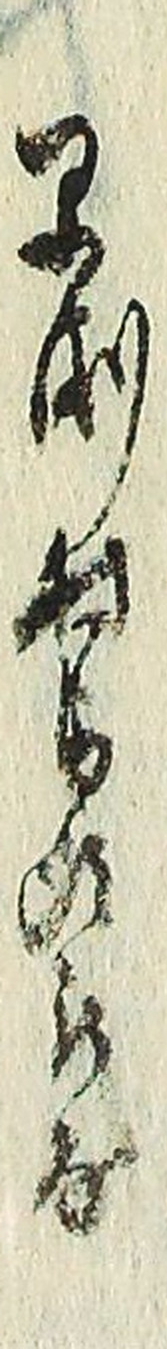早渕村与頭庄屋
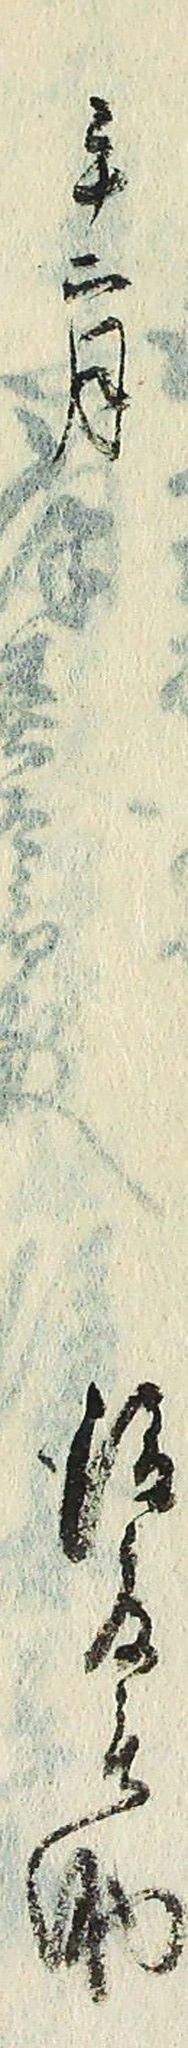午二月後藤庄助
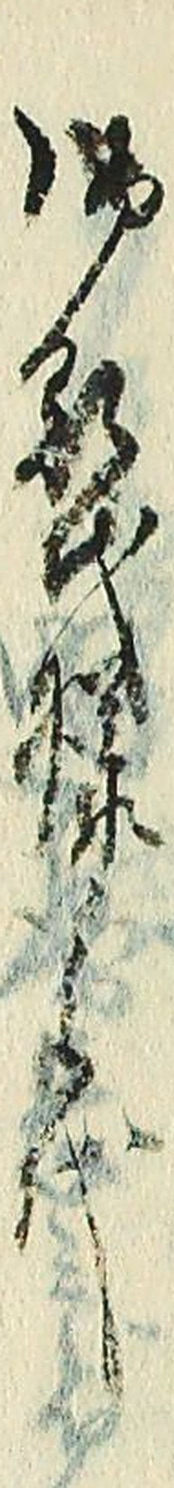御郡代様御手代
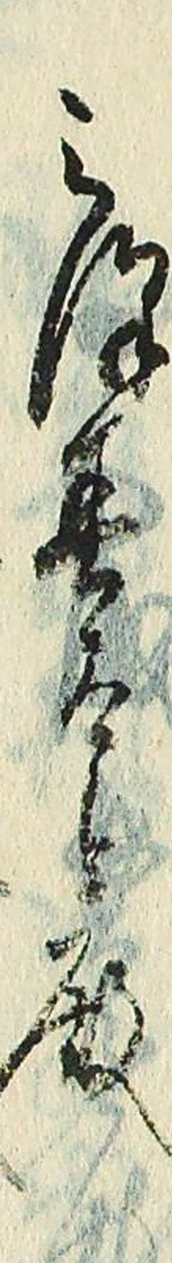三沢春太郎殿
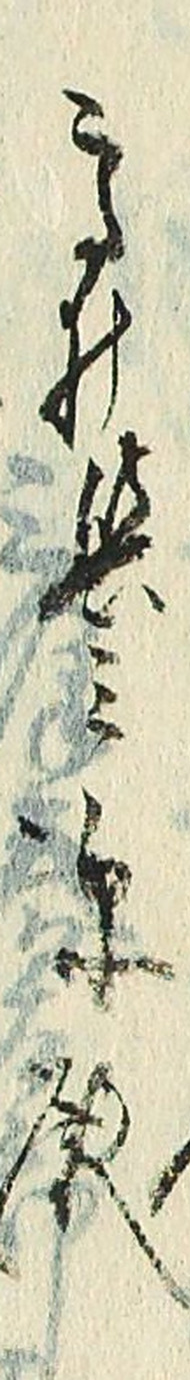高井与三兵衛殿
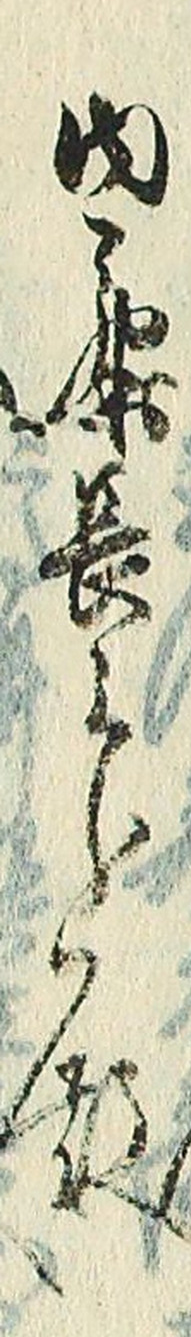内藤長三郎殿
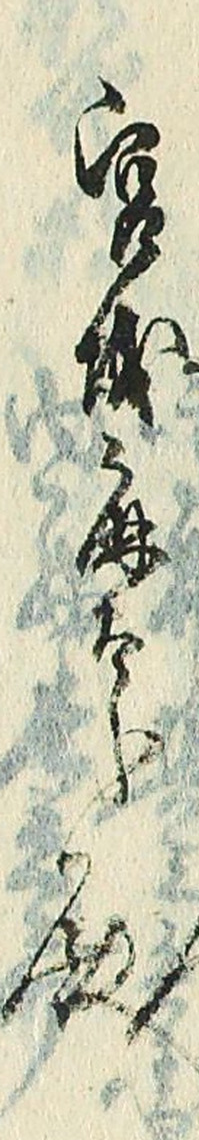宮城麻太郎殿

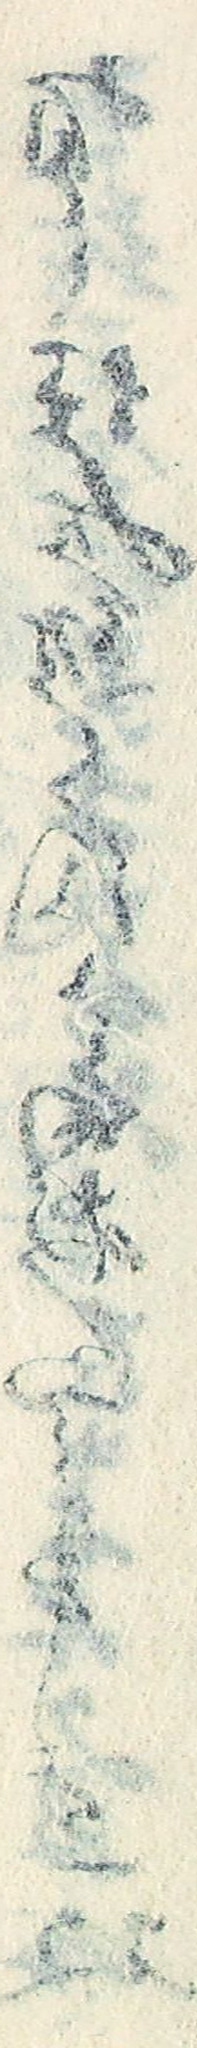四月廿二日
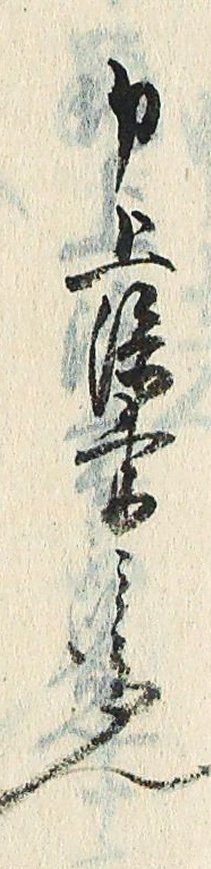申上添書之覚
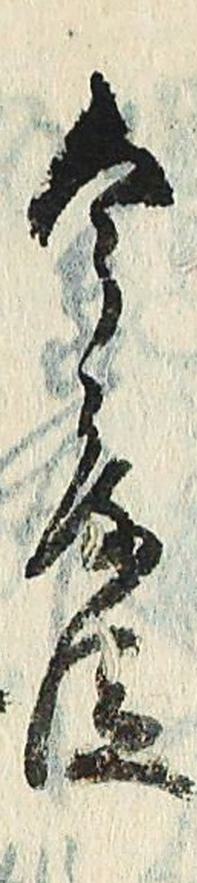今度従
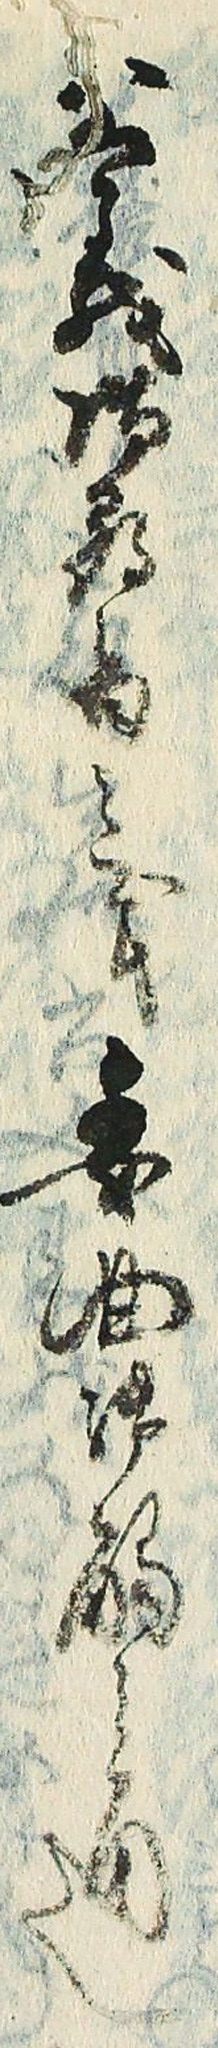公義御尋者之義委曲御触之通
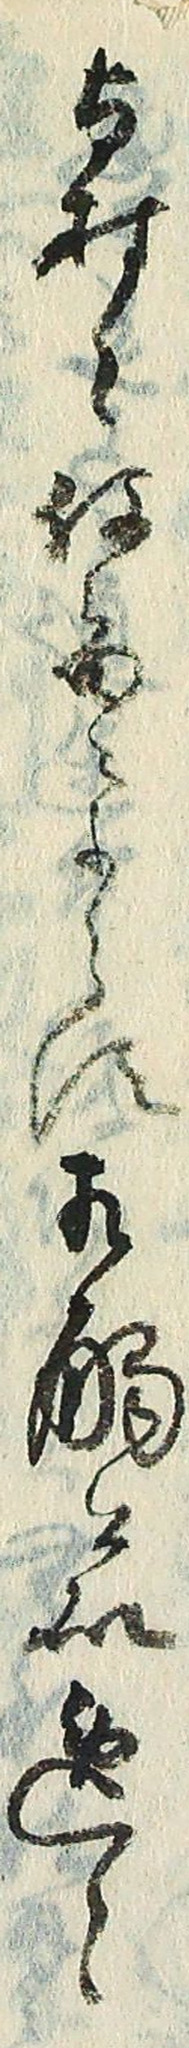与村々何者によらす相触候処逸々
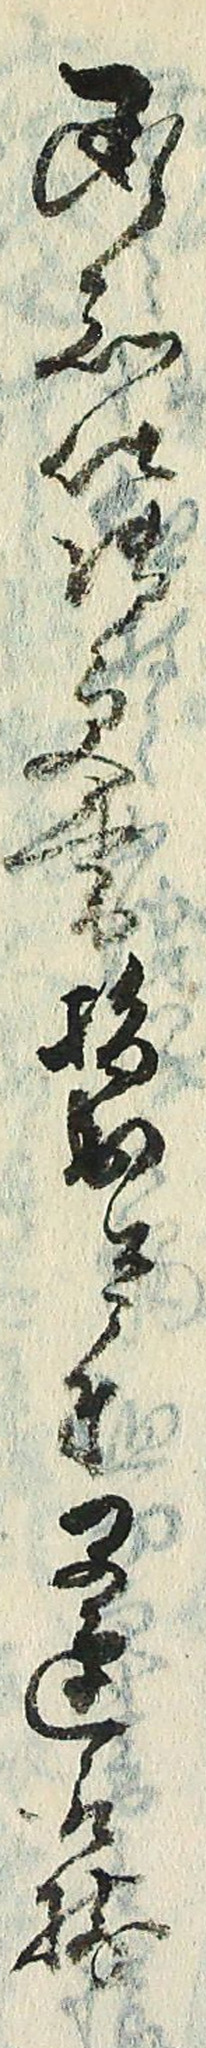承知仕御受書指出候に付早速取揃
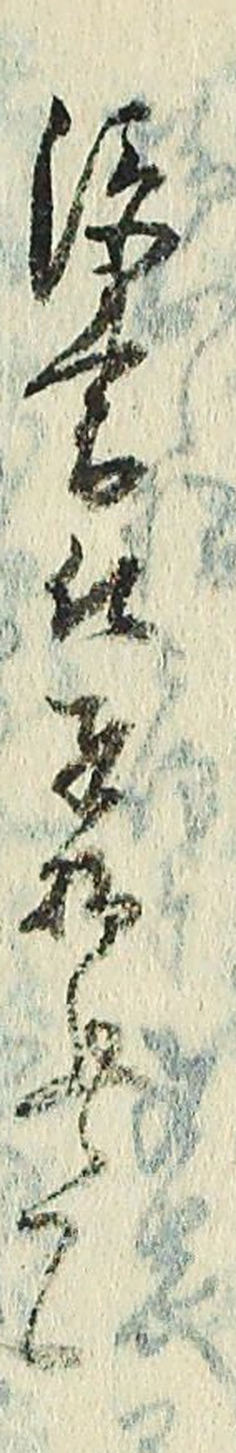添書仕奉指上候以上
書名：諸御用御□受書控
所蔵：鳴門教育大学 Naruto University of Education
